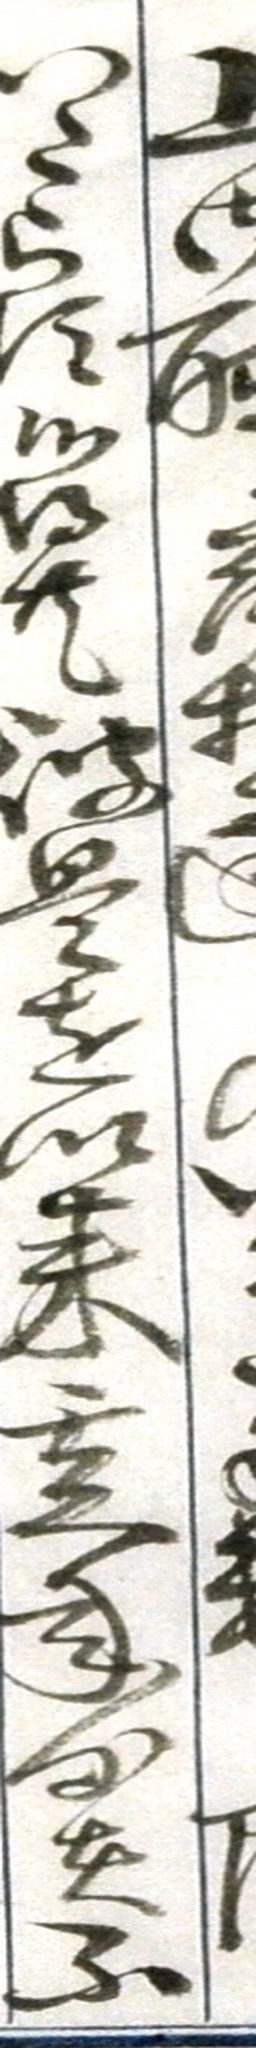いたらす候得共彼是を以来亥年ゟ者不
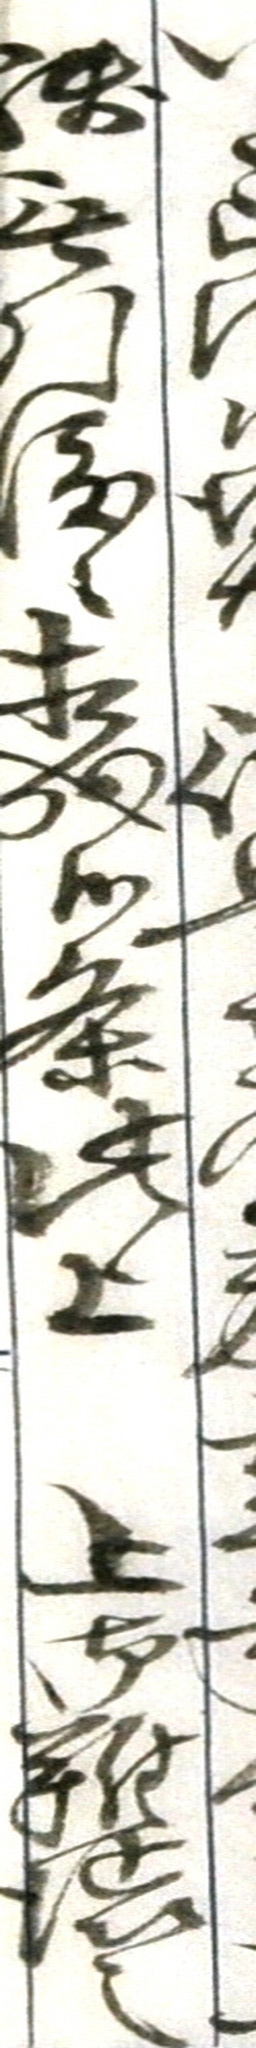残無引渡候相成候条此上上御難渋之

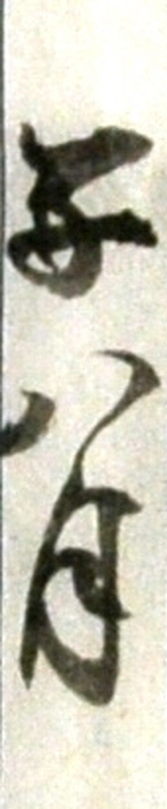子八月
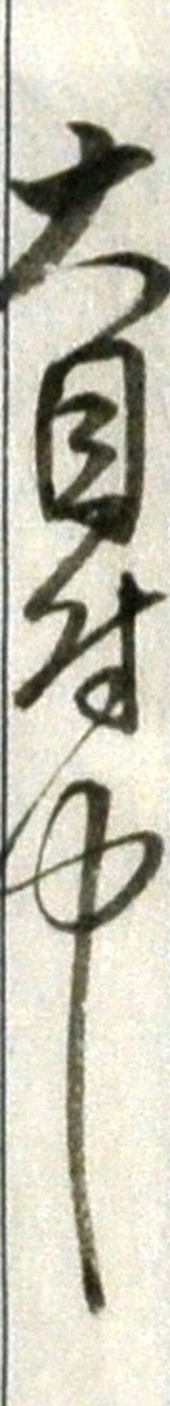大目付中
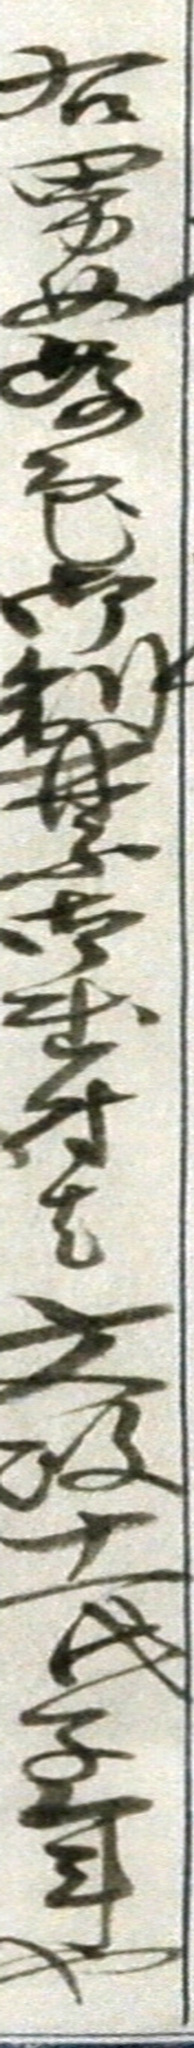右男女好色御制禁御書付は文政十一戊子年也
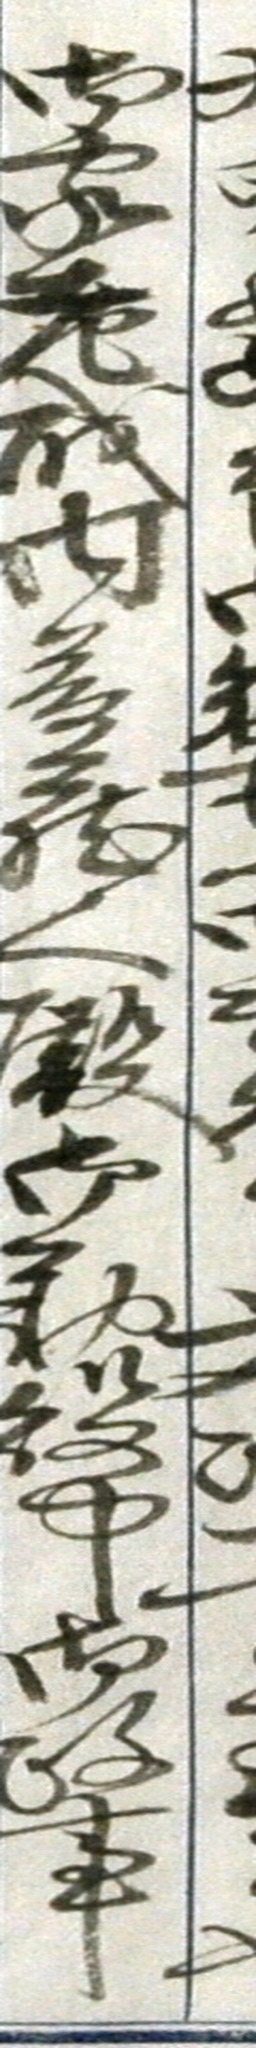御家老職内藤蔵人殿御勤役中御政事
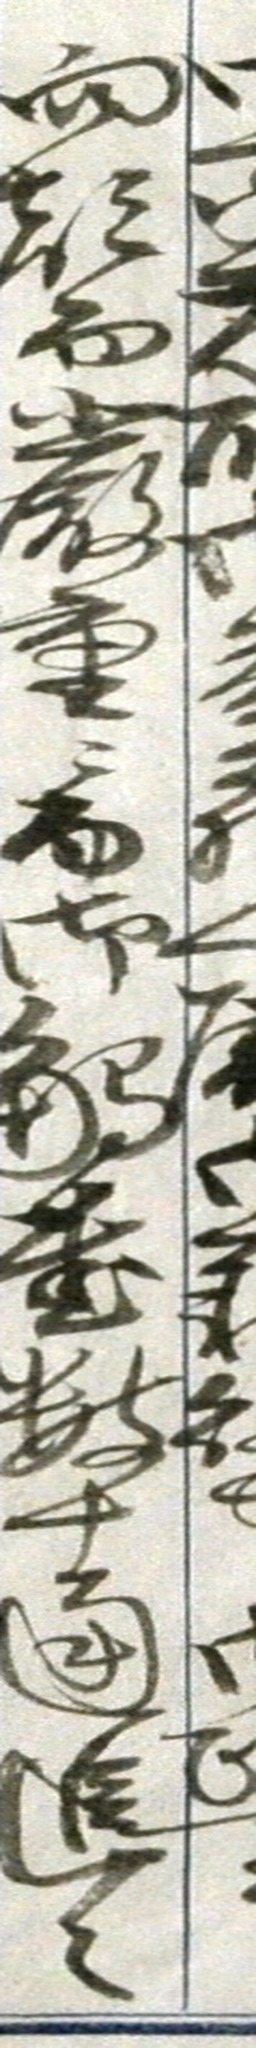向都而厳重ニ而御触置数十通追々
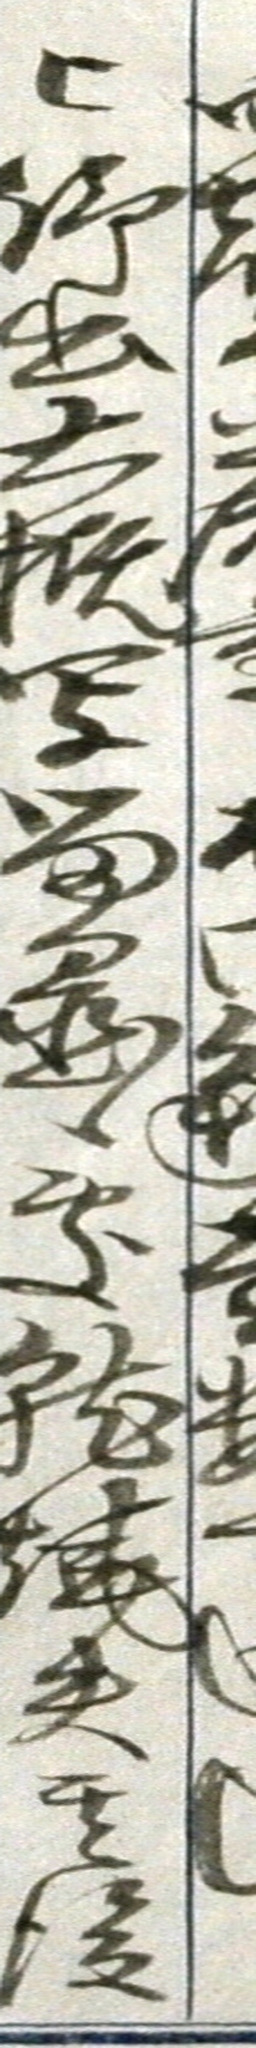被仰出大概写留置候処就焼失其後
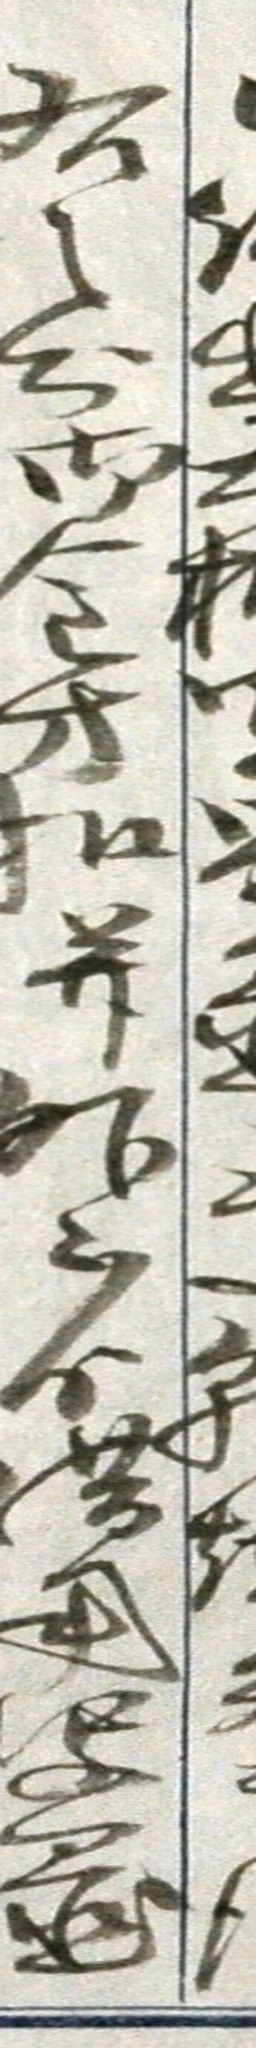右之分御金方扣并外々ゟ借用写置
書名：御倹約御直書并仰書
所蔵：伊那市立高遠町図書館・合同会社AMANE
